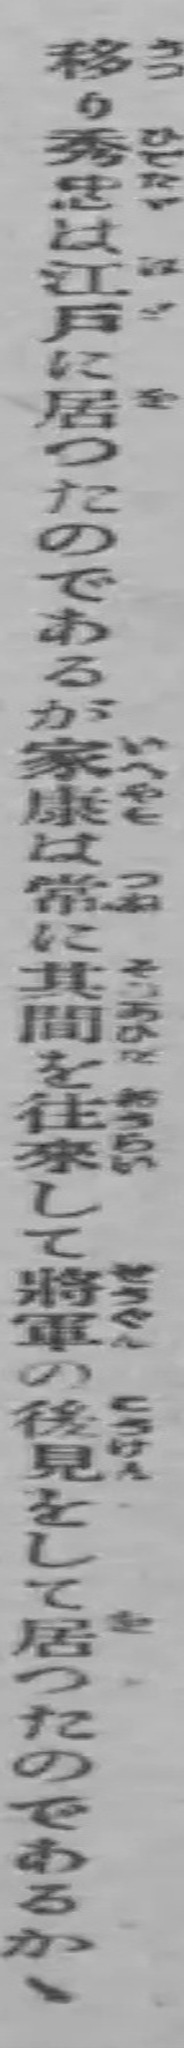移り秀忠は江戸に居つたのであるが家康は常に其間を往来して将軍の後見をして居つたのであるかゝ
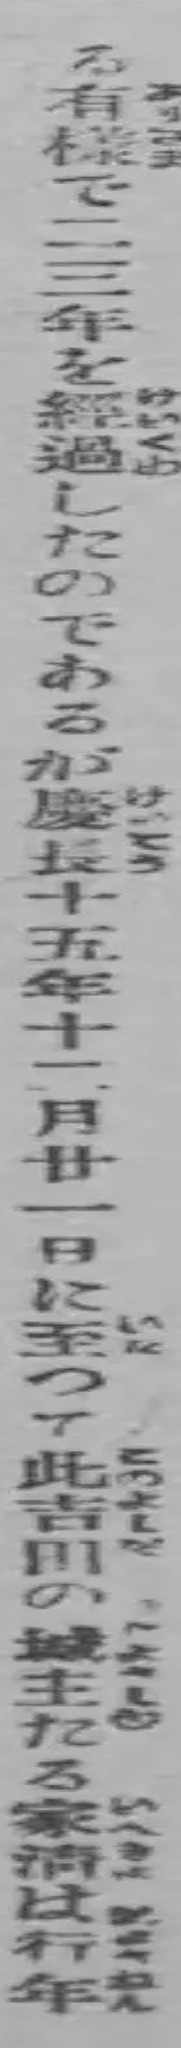家清卒する有様で二三年を経過したのであるが慶長十五年十二月廿一日に至つて此吉田の城主たる家清は行年
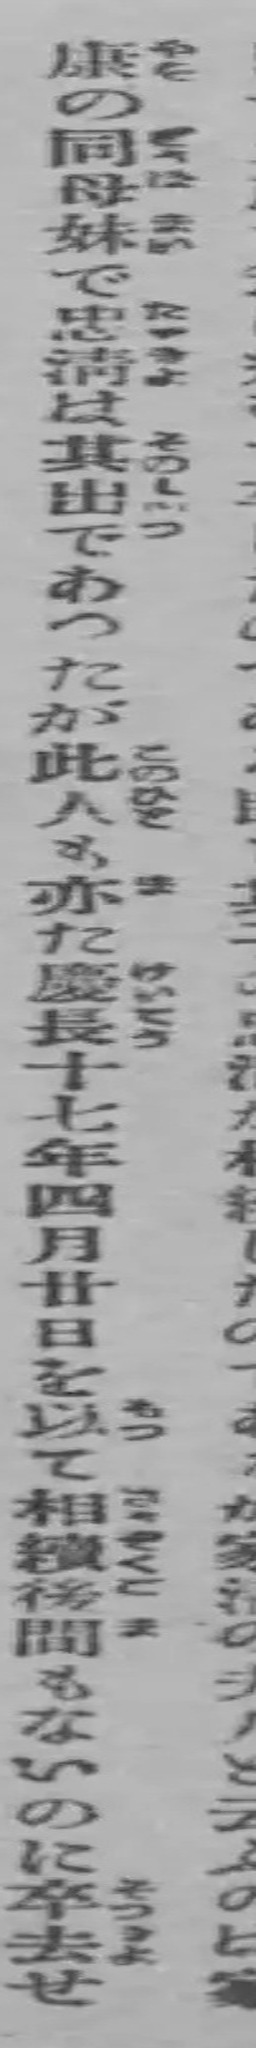忠清卒す康の同母妹で忠清は其出であつたが此人も亦た慶長十七年四月廿日を以て相続後間もないのに卒去せ
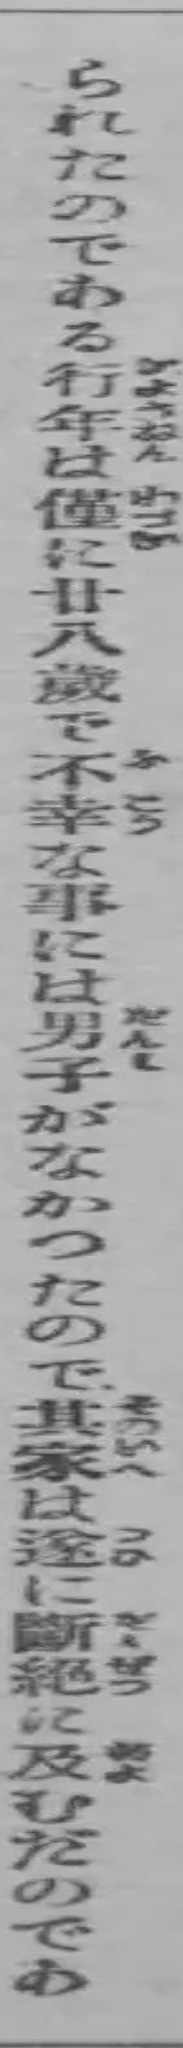られたのである行年は僅に廿八歳で不幸な事には男子がなかつたので其家は遂に断絶に及むだのであ
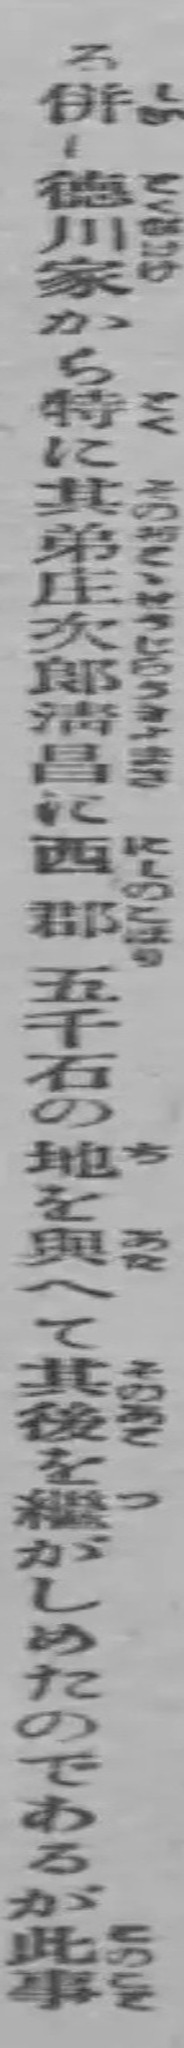松平清昌る併し徳川家から特に其弟庄次郎清昌に西郡五千石の地を与へて其後を継がしめたのであるが此事
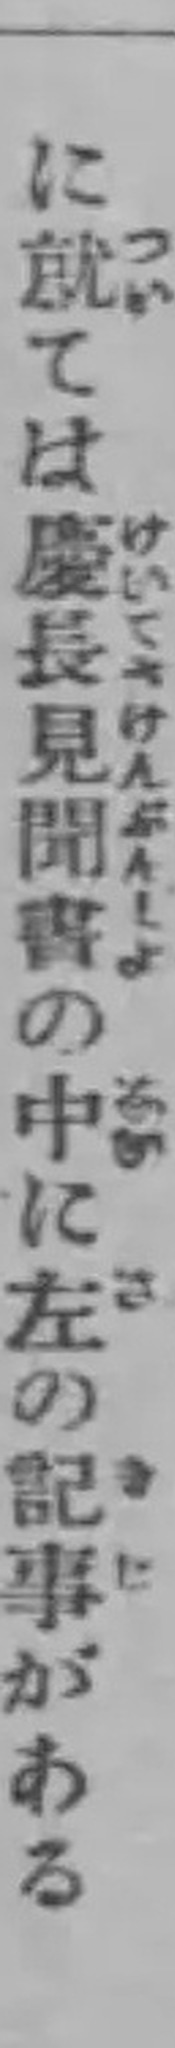に就ては慶長見聞書の中に左の記事がある
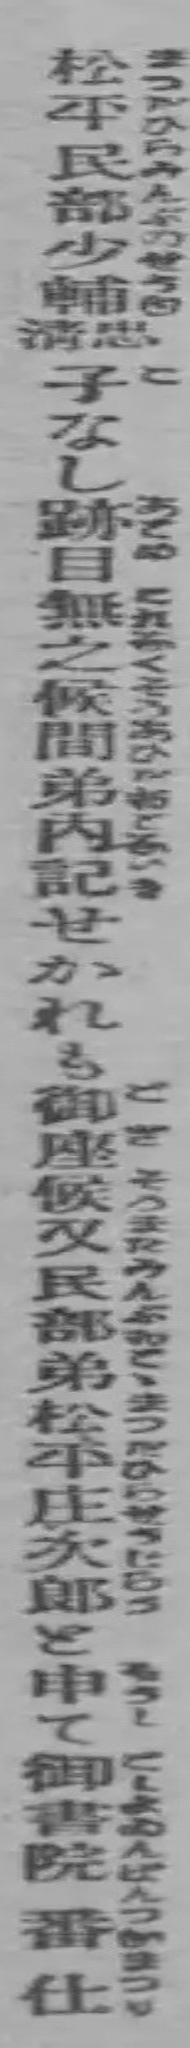松平民部少輔忠清子なし跡目無之候間弟内記せかれも御座候又民部弟松平庄次郎と申て御書院番仕

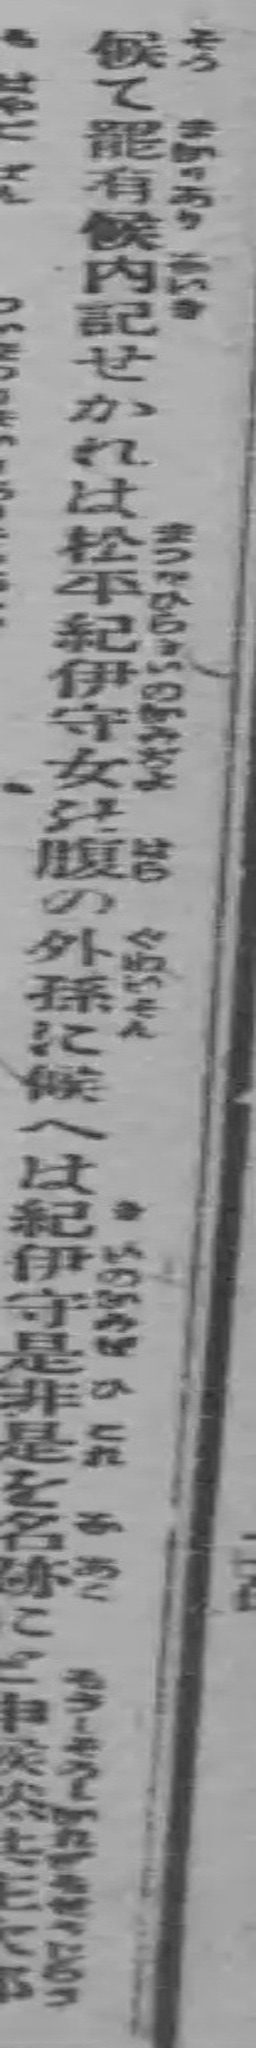候て罷有候内記せかれは松平紀伊守女の腹の外孫に候へは紀伊守是非是を名跡にと申候然共庄次郎
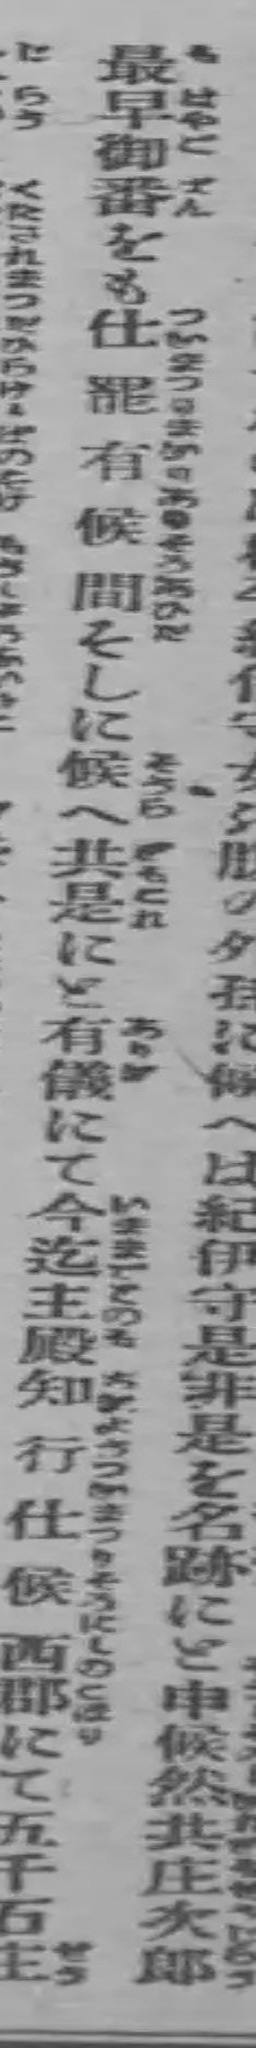最早御番をも仕罷有候間そしに候へ共是にと有儀にて今迄主殿知行仕候西郡にて五千石庄
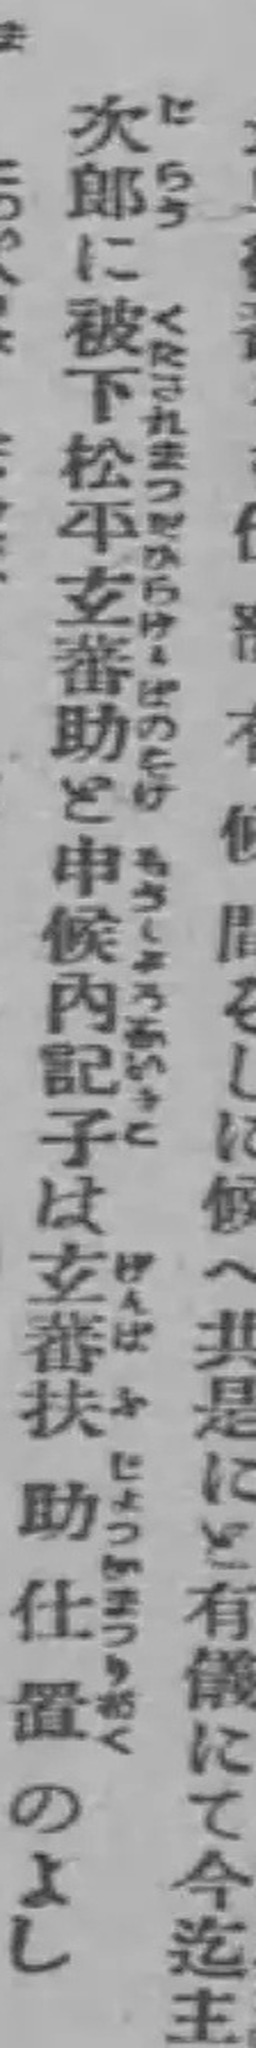次郎に被下松平玄蕃助と申候内記子は玄蕃扶助仕置のよし
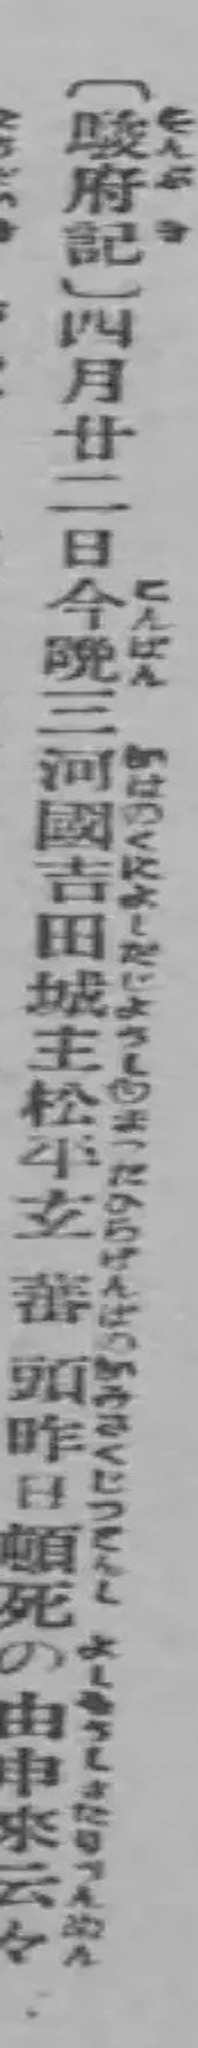[駿府記]四月廿二日今晩三河国吉田城主松平玄蕃頭昨日頓死の由申来云々
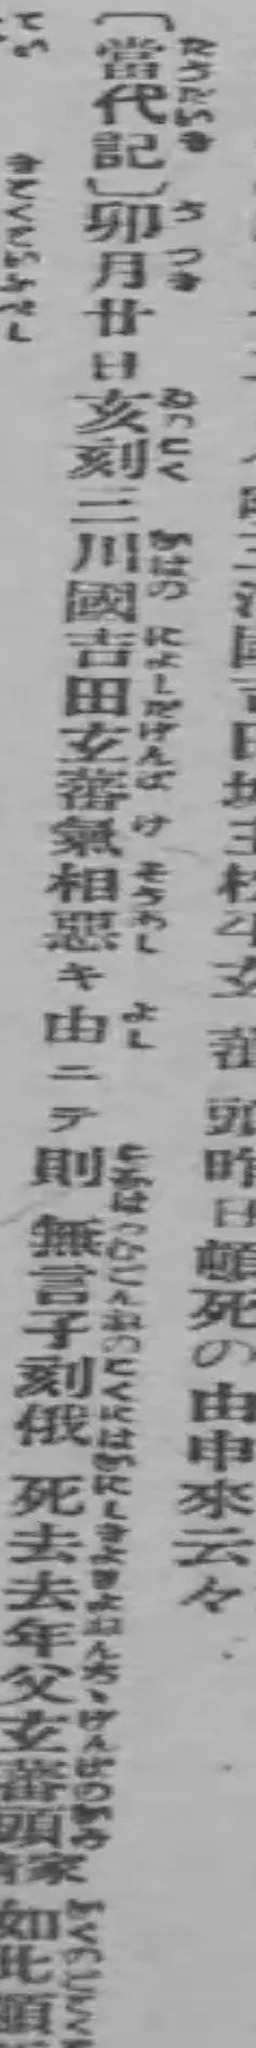[当代記]卯月廿日亥刻三河国吉田玄蕃気相悪キ由ニテ則無言子刻俄死去去年父玄蕃頭家清如此頓死
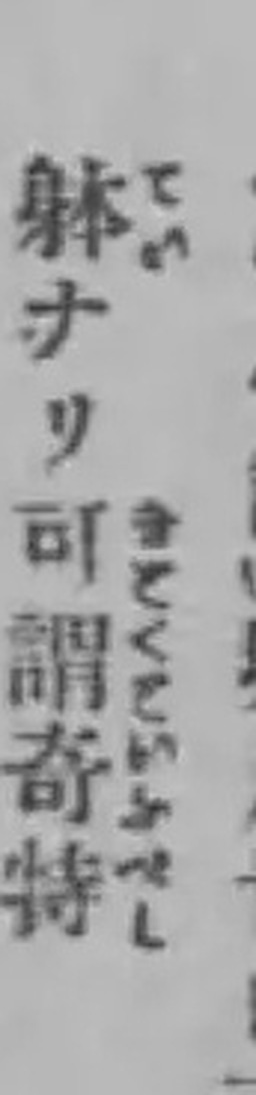躰ナリ可謂奇特
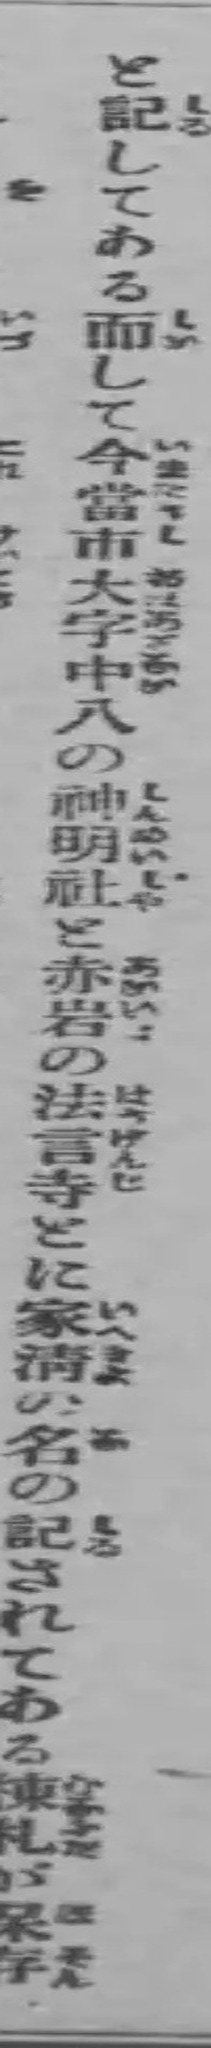と記してある而して今当市大字中八の神明社と赤岩の法言寺とに家清の名の記されてある棟札が保存
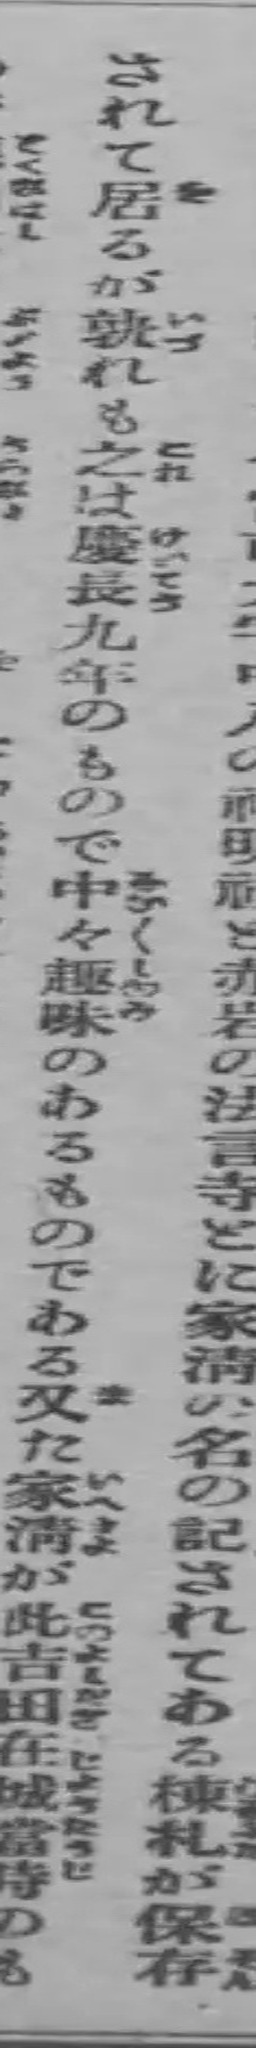されて居るが孰れも之は慶長九年のもので中々趣味のあるものである又た家清が此吉田在城当時のも
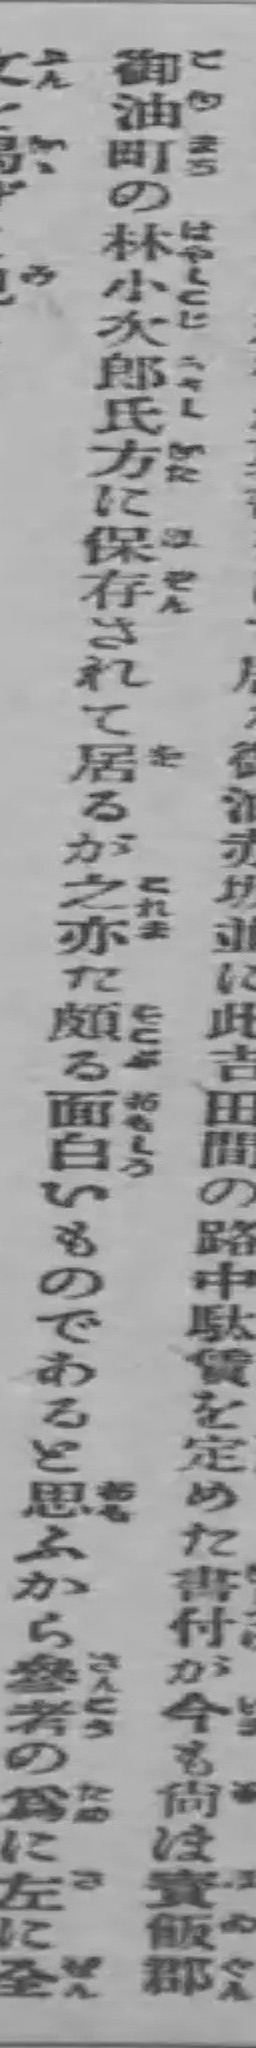状御油町の林小次郎氏方に保存されて居るが之亦た頗る面白いものであると思ふから参考の為に左に全
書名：豊橋市史談
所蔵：国立国会図書館 National Diet Library, JAPAN
